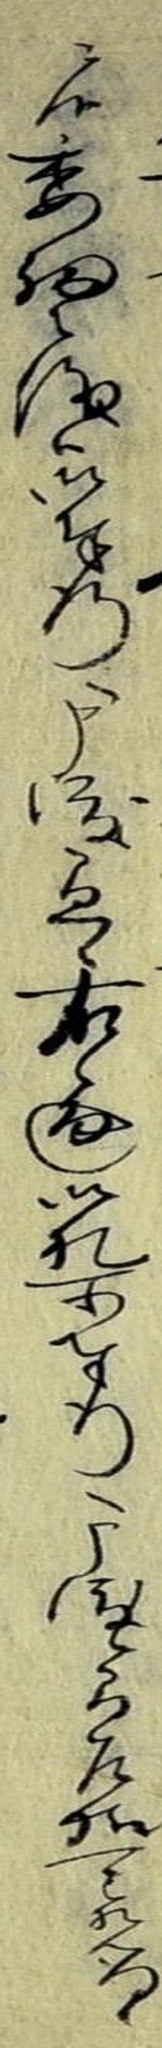ニ候委細之儀ハ御奉行へ申渡置候右之通御札所奉行へ申渡候間左様可被相心得候
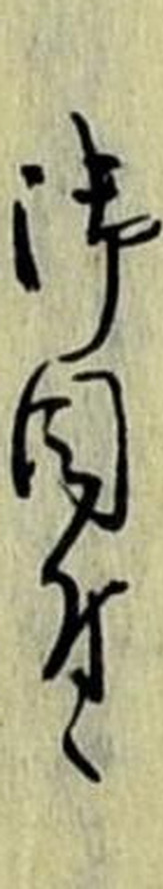御目付へ
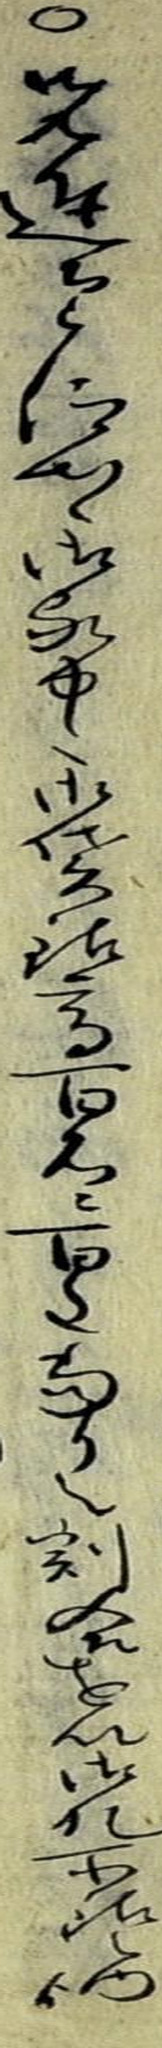〇先達而被仰出候御家中へ御貸銀高百石ニ百匁当り之割合を以御札所銀之内ゟ
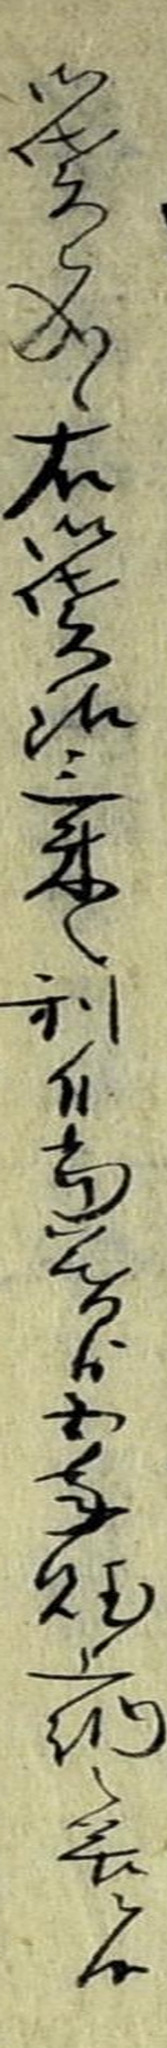御貸被成候右御貸銀三朱之利付当暮ゟ五年賦上納之筈ニ候
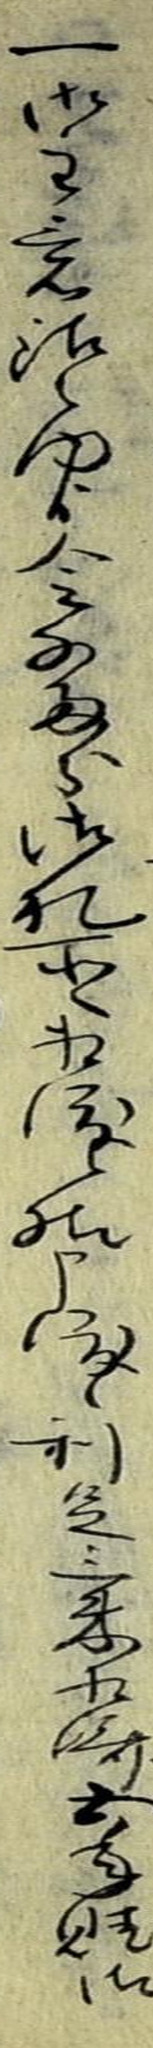一御主意銀之内ゟ金千両分御札所へ相渡候様申渡候利足三朱相済五年賦御
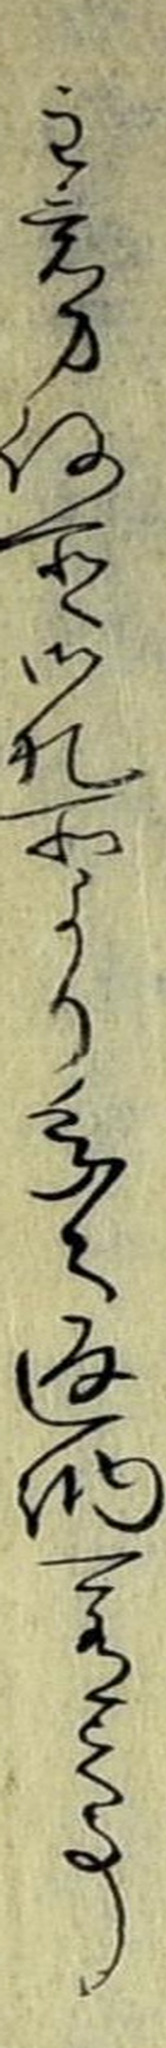主意方役所へ御札所より年々返納可有之事
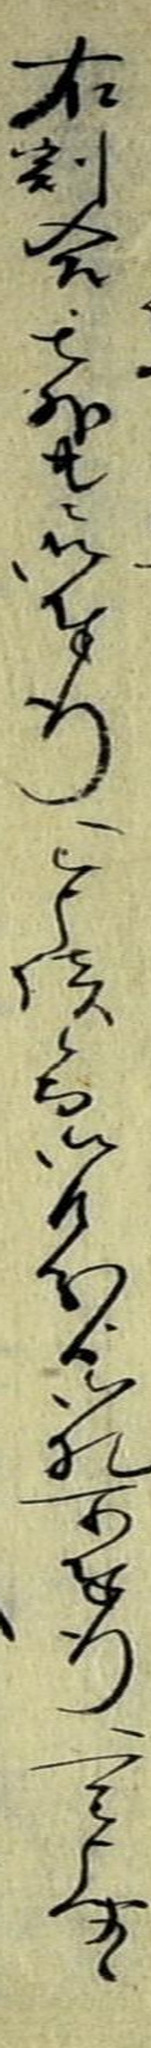右割合其外共ニ御奉行へ被申談候而御自分ゟ御札所奉行へ可被申聞候
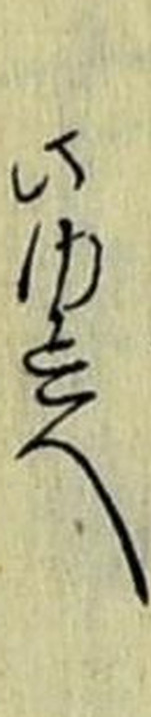此内壱人
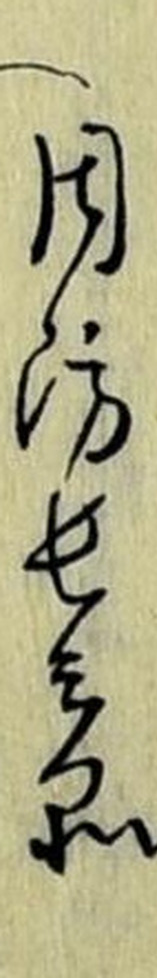周防長兵衛
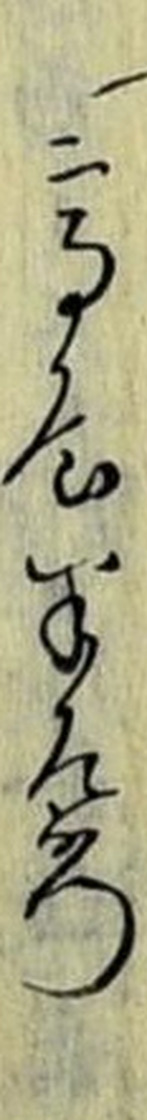高屋半左衛門
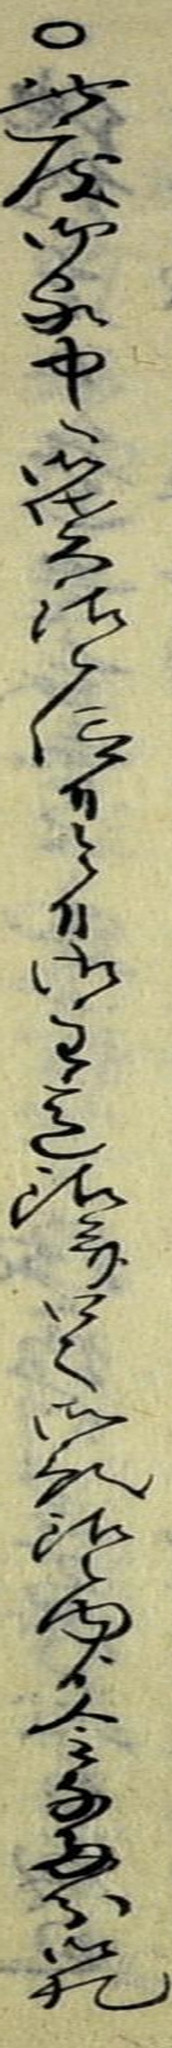〇此度御家中へ御貸銀被仰付候ニ付御主意銀并口々御預銀之内ゟ金千両分御札
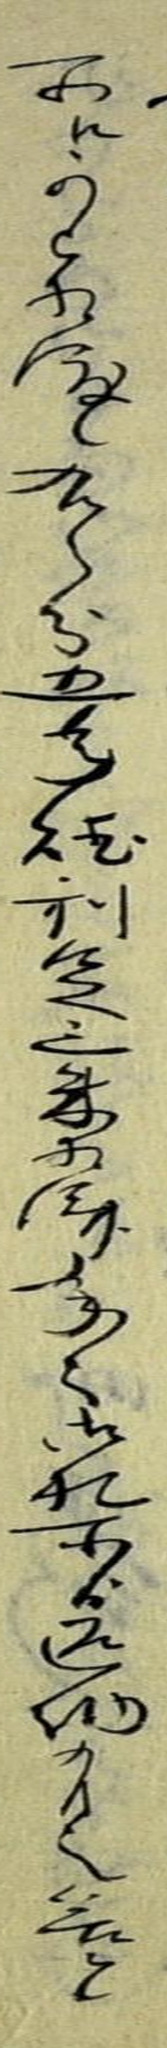所江可被相渡候右之分五年賦利足三朱相済年々御札所ゟ返納可有之筈ニ候
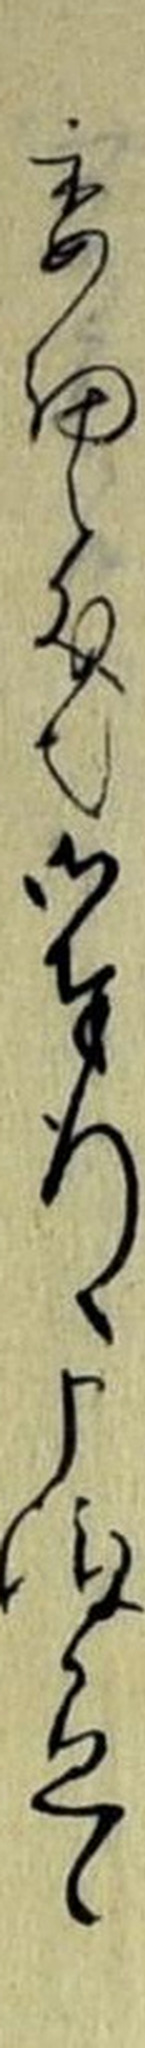委細之義者御奉行へ申渡置候
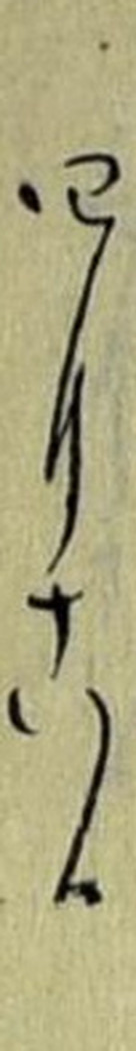四月十八日
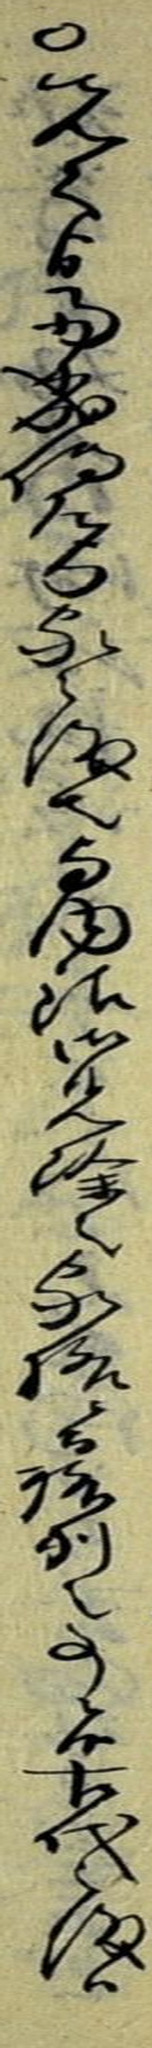〇先々ゟ雨森伝左衛門家之儀者与内銀御見除之家格ニ而格別之事ニ候古代之儀ハ
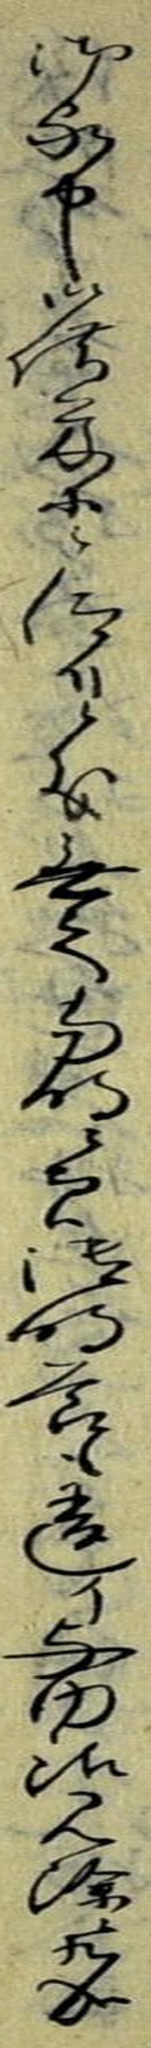御家中御借米等被仰付候義無之当時ニ而ハ御時節も違イ与内銀見除ニ相成
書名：命令之部 三
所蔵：福井県文書館 Fukui Prefectural Archives
